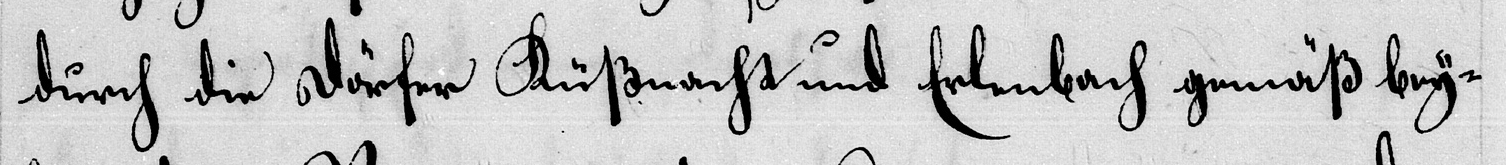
durch die Dörfer Küßnacht und Erlenbach gemäß bey¬
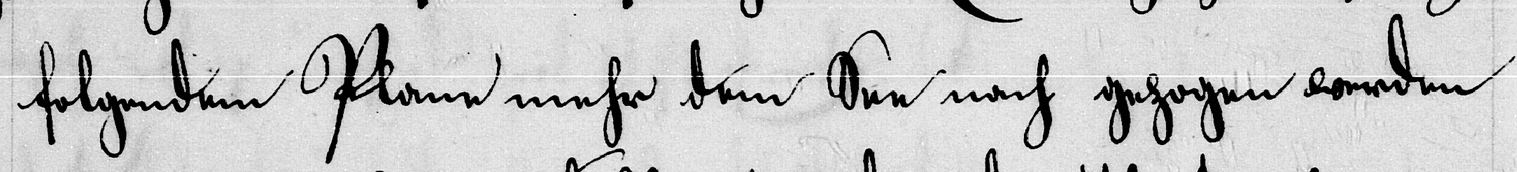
folgendem Plane mehr dem See nach gezogen werden
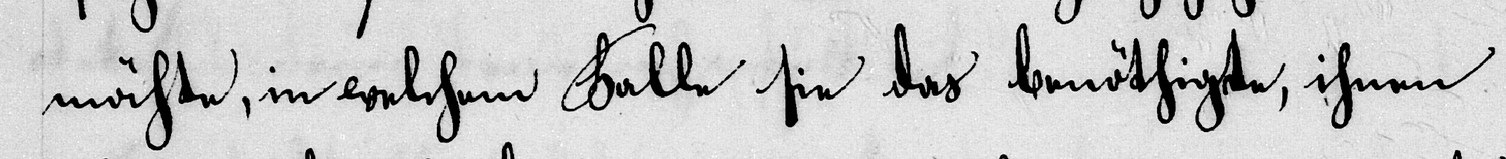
möchte, in welchem Falle sie das benöthigte, ihnen
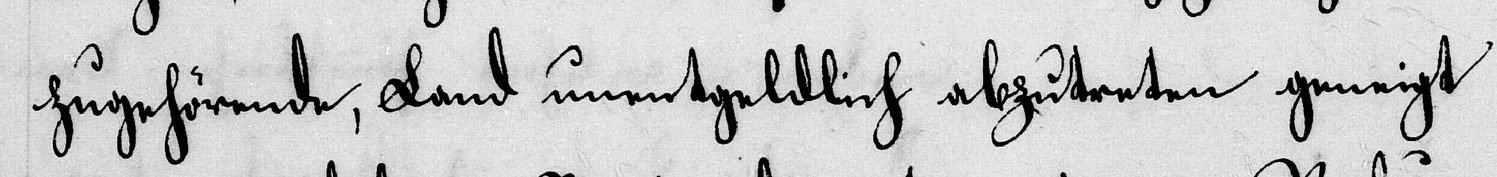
zugehörende, Land unentgeldlich abzutreten geneigt
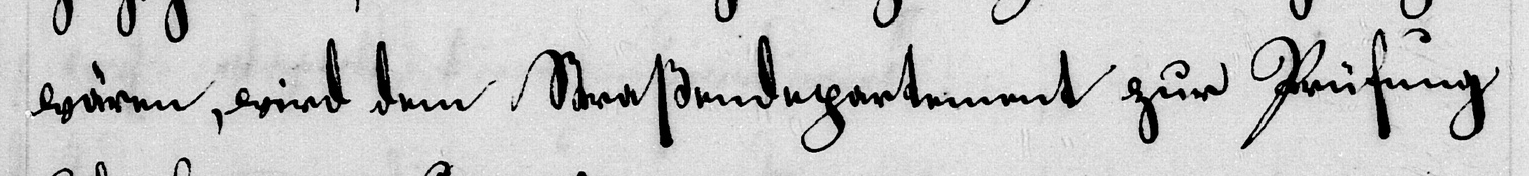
wären, wird dem Straßendepartement zur Prüfung
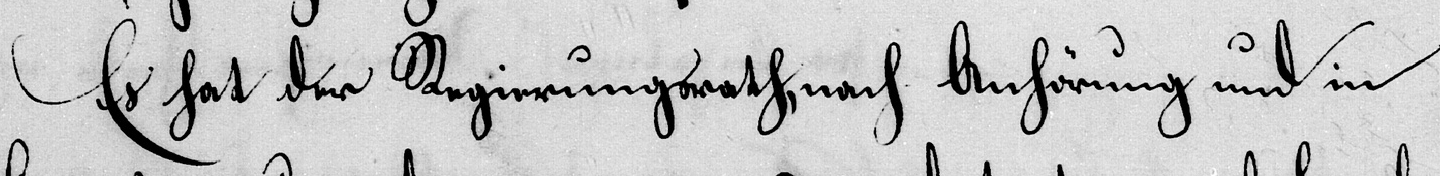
Es hat der Regierungsrath, nach Anhörung und in
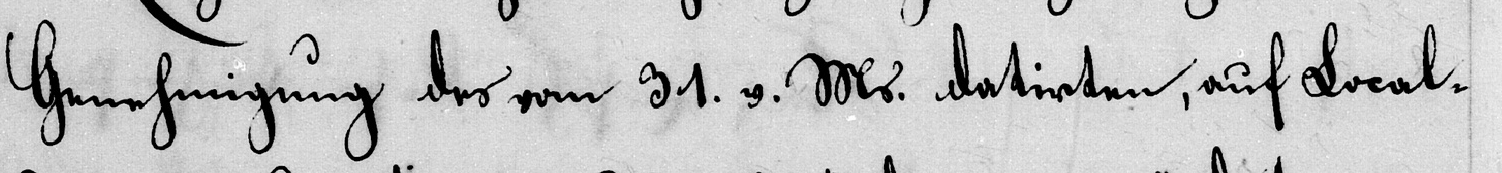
Genehmigung des vom 31. v. Ms. datirten, auf Local¬
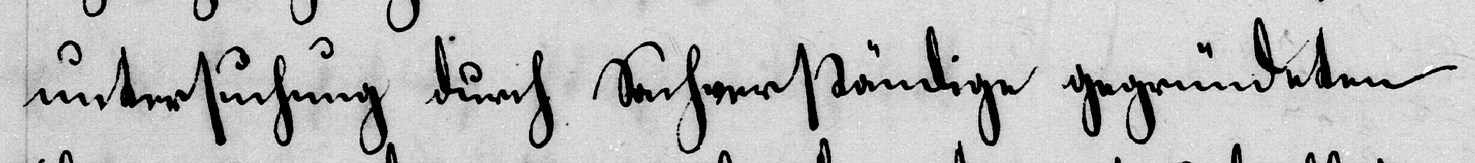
untersuchung durch Sachverständige gegründeten
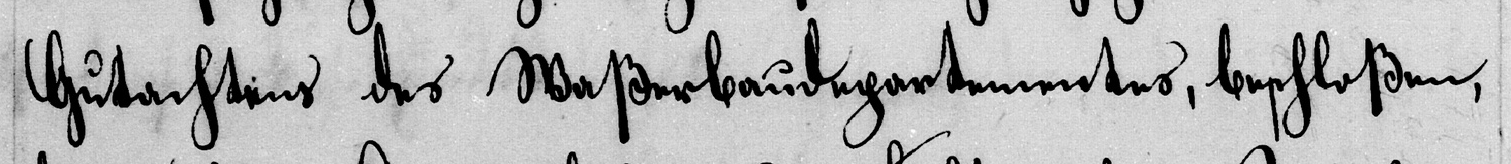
Gutachtens des Waßerbaudepartementes, beschloßen,
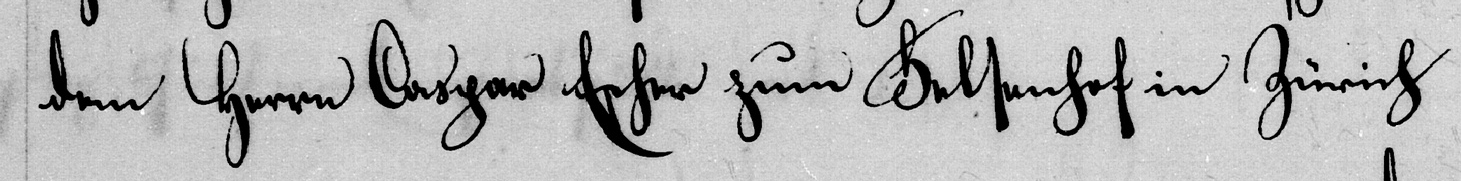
dem Herrn Caspar Escher zum Felsenhof in Zürich
